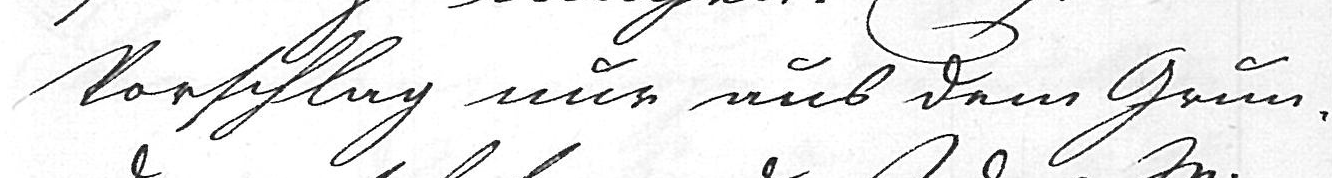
Vorschlag nur aus dem Grun-
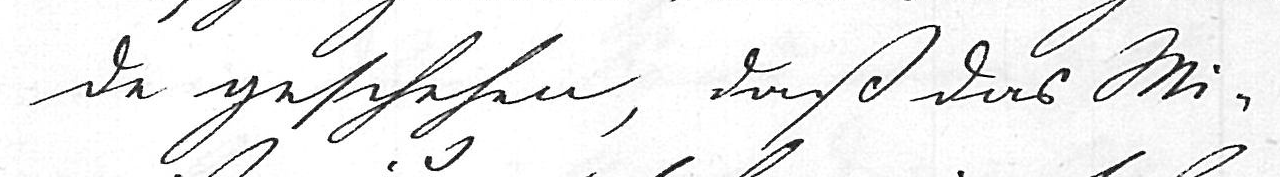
de geschehen, daß das Mi-
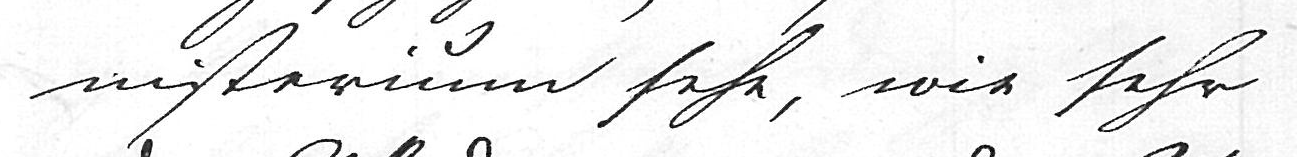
nisterium sehe, wie sehr
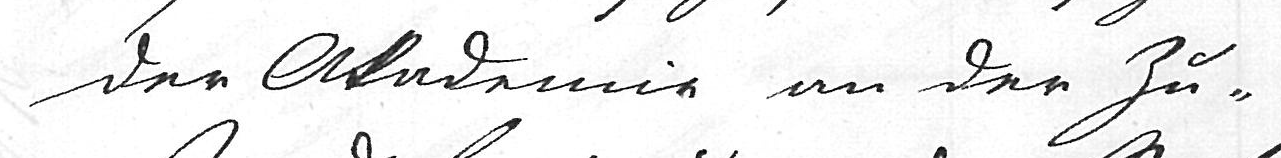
der Akademie an der Zu-
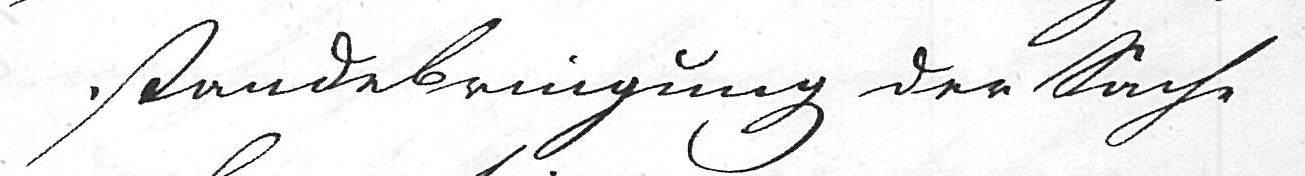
standebringung der Sache
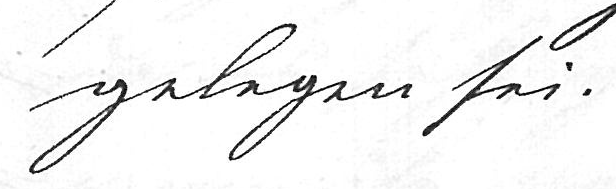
gelegen sei.
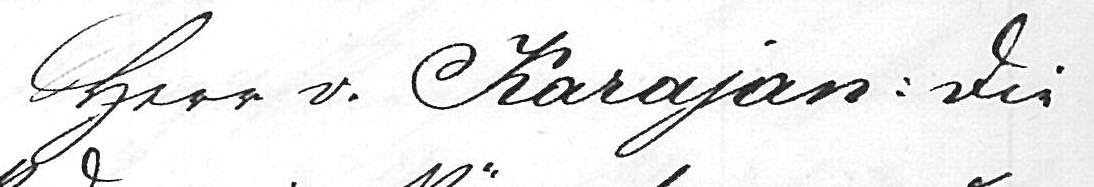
Herr v. Karajan: Die
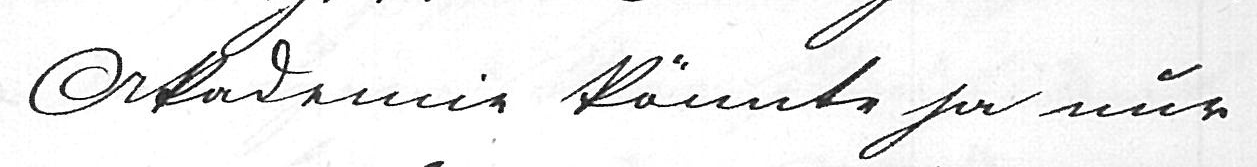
Akademie könnte ja nur
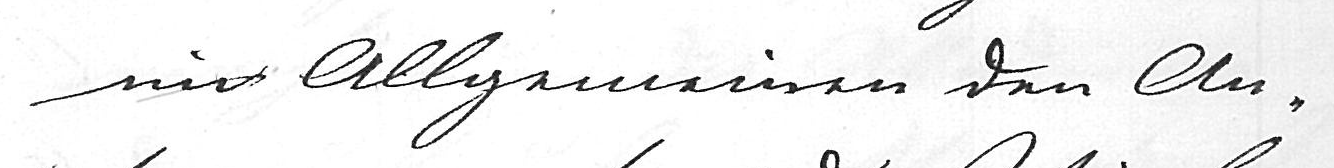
im Allgemeinen den An-
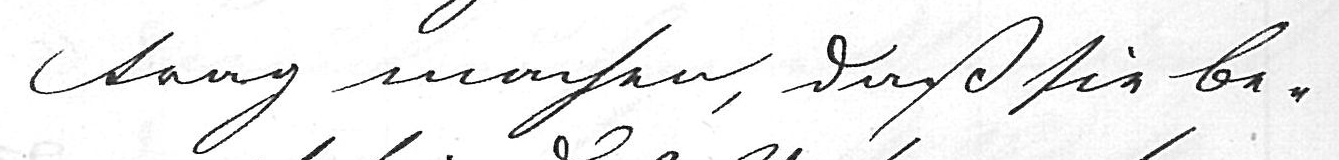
trag machen daß sie be-
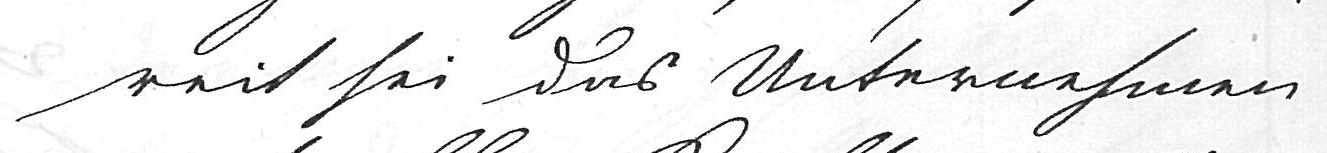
reit sei das Unternehmen
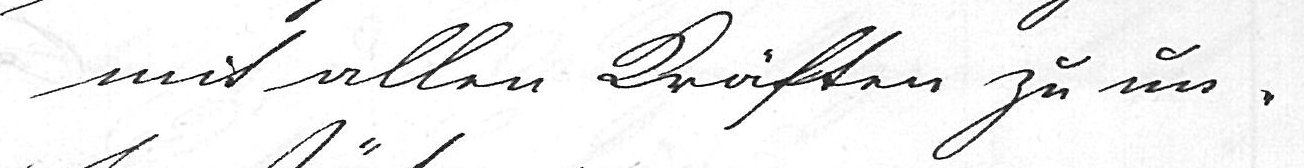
mit allen Kräften zu un-
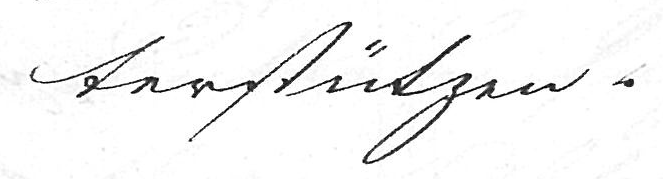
terstützen.
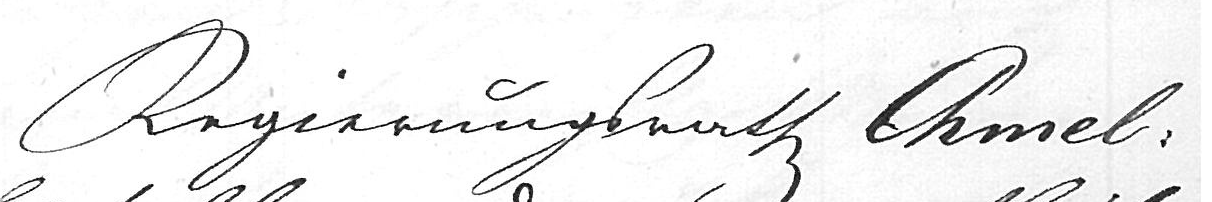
Regierungsrath Chmel:
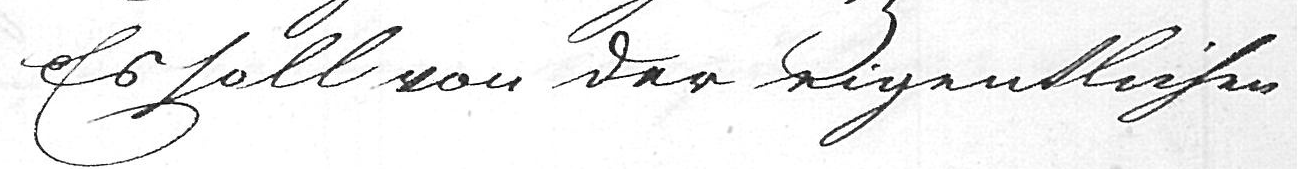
Es soll von der eigentlichen
